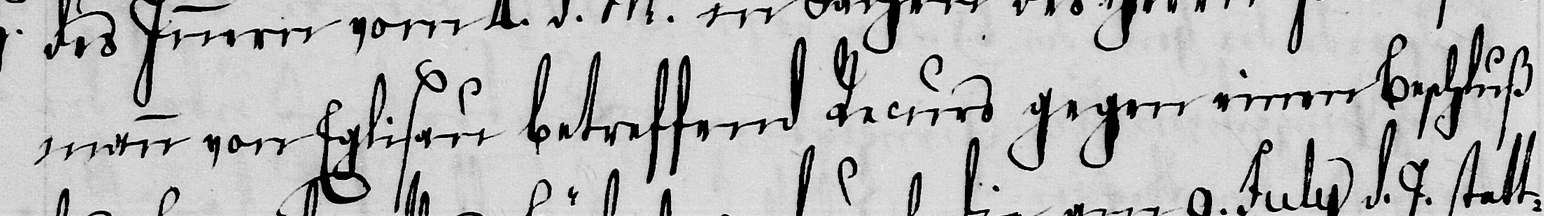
lmann von Eglisau betreffend Recurs gegen einen Beschluß
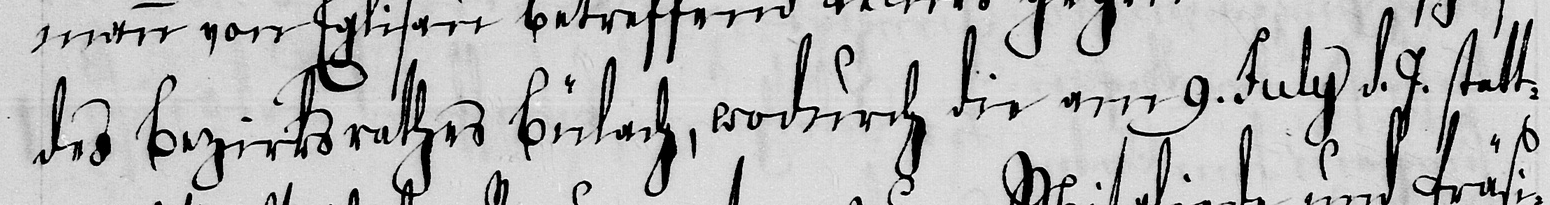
des Bezirksrathes Bülach, wodurch die am 9. July d. J. stat¬
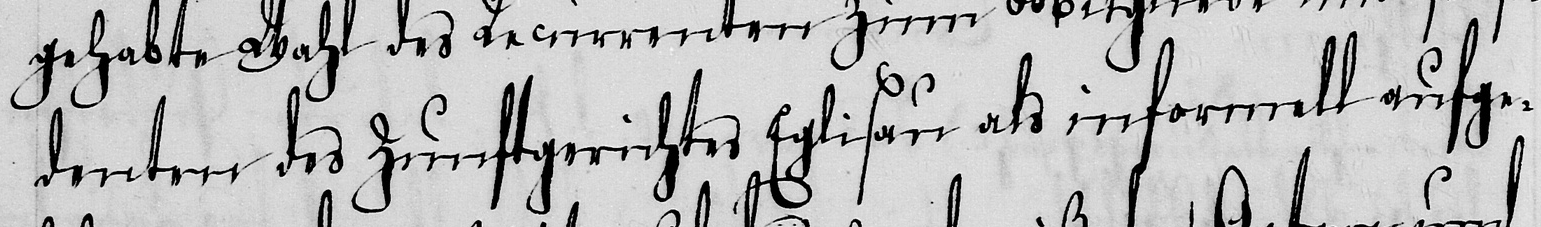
denten des Zunftgerichtes Eglisau als informell aufge¬
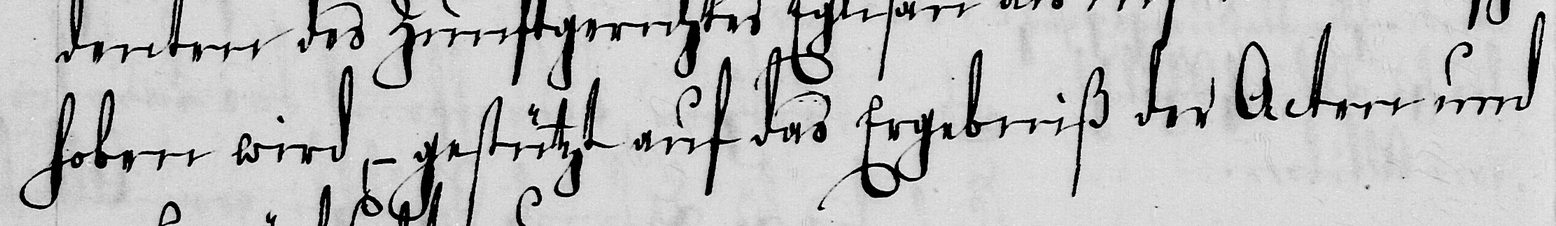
hoben wird, – gestützt auf das Ergebniß der Acten und
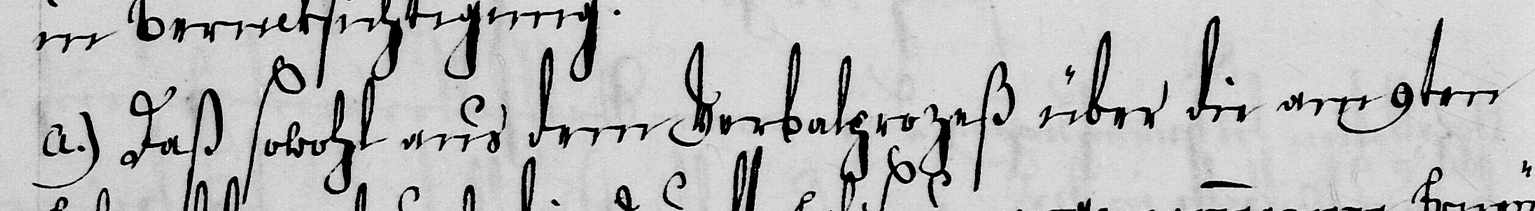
a.) Daß sowohl aus dem Verbalprozeß über die am 9ten
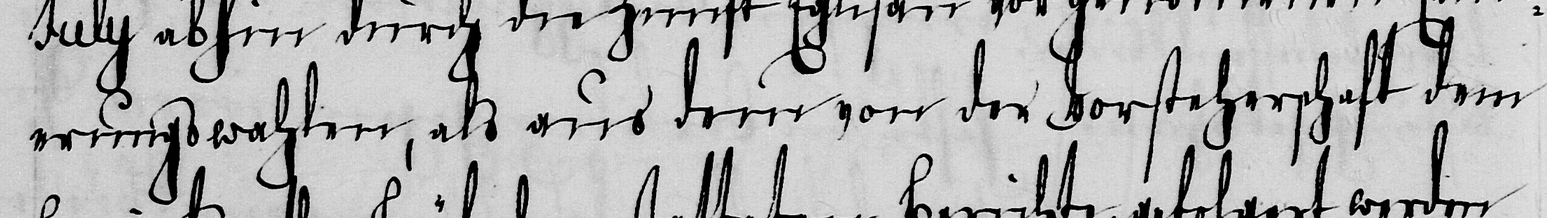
erungswahlen, als aus dem von der Vorsteherschaft dem
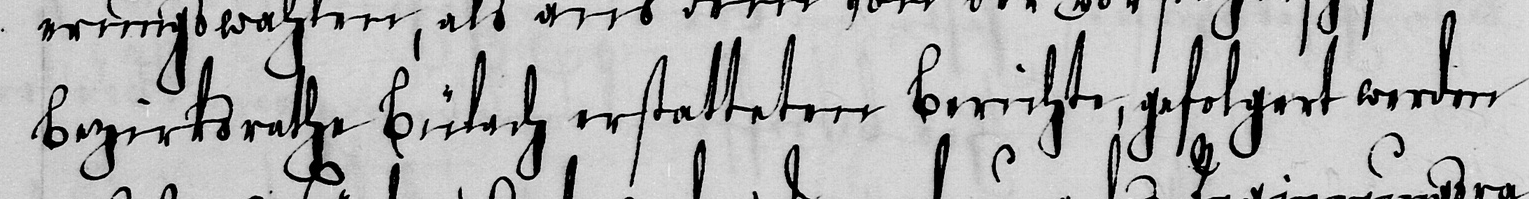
Bezirksrathe Bülach erstatteten Berichte, gefolgert werden
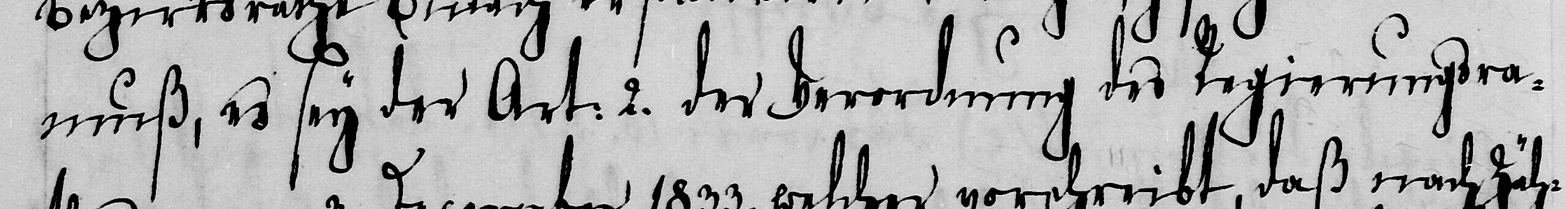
muß, es sey der Art: 2. der Verordnung des Regierungsra¬
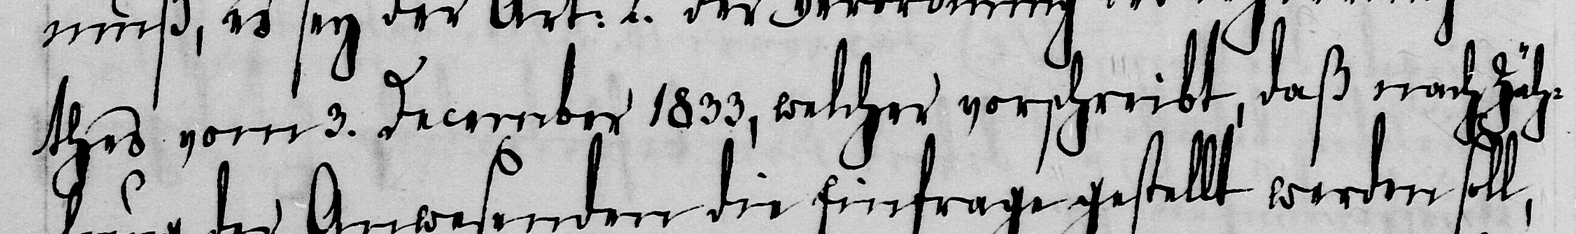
thes vom 3. December 1833, welcher vorschreibt, daß nach Zäh¬
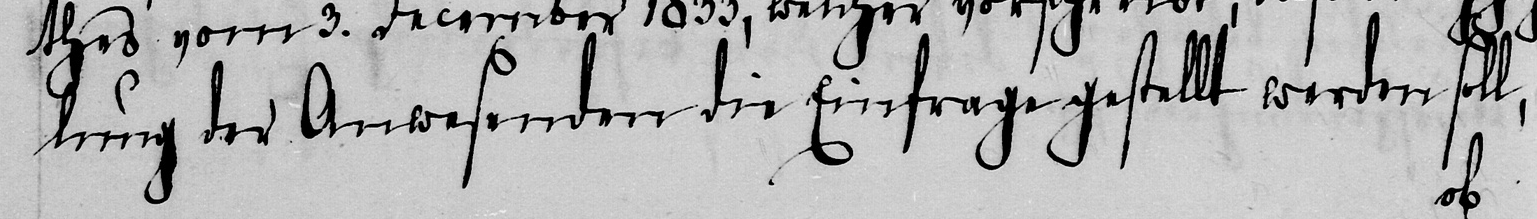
lung der Anwesenden die Einfrage gestellt werden sol¬
